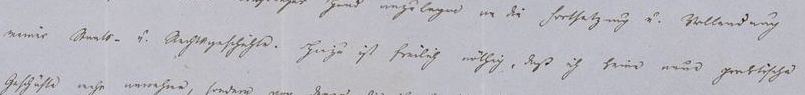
meiner Staats- u. Rechtsgeschichte. Hiezu ist freilich nöthig, daß ich keine neue praktische
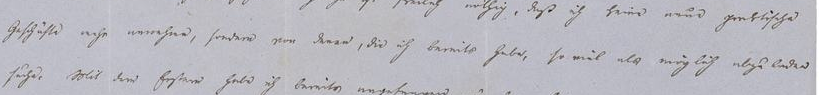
Geschäfte mehr annehme, sondern von denen, die ich bereits habe, so viel als möglich abzuladen
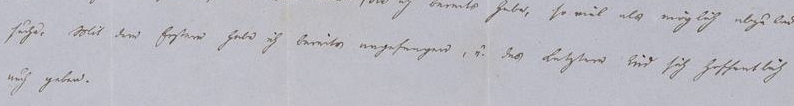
suche. Mit dem Erstern habe ich bereits angefangen, u. das letztere wird sich hoffentlich
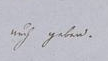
auch geben.
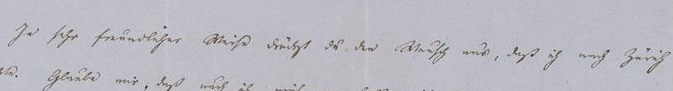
In sehr freundschaftlicher Weise drückst Du den Wunsch aus, daß ich nach Zürich
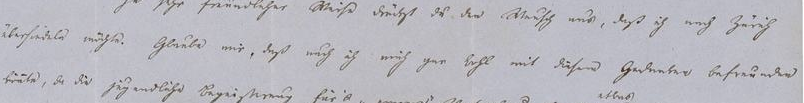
übersiedeln möchte. Glaube mir, daß auch ich mich gar wohl mit diesem Gedanken befreunden
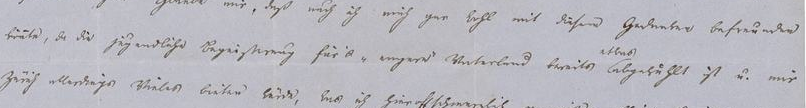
könnte, da die jugendliche Begeisterung für's «engere» Vaterland bereits etwas abgekühlt ist u. mir
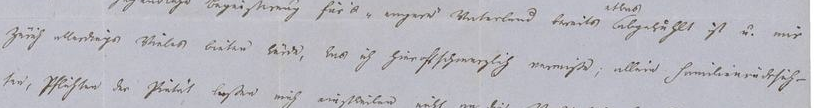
Zürich allerdings Vieles bieten würde, was ich hier oft schmerzlich vermisse; allein Familienrücksich-
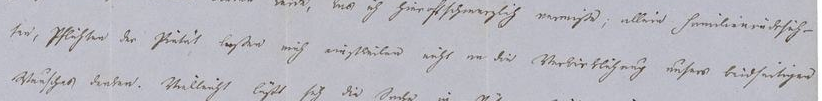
ten, Pflichten der Pietät lassen mich einstweilen nicht an die Verwirklichung unsers beidseitigen
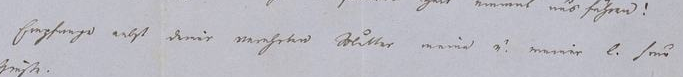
Empfange nebst Deiner verehrten Mutter meine u. meiner l. Frau
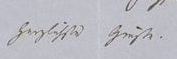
herzlichste Grüße.
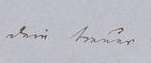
Dein treuer
